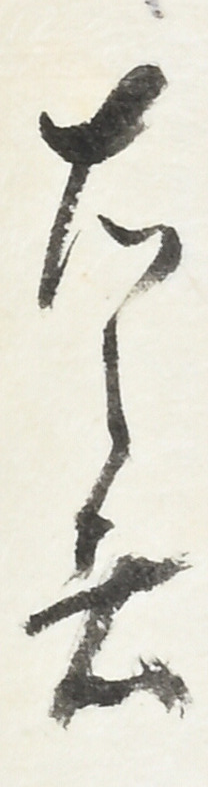右之者
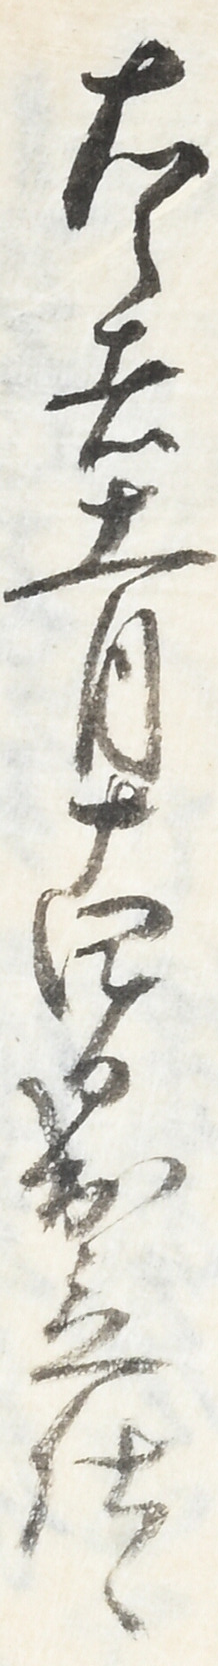右之者同廿五日出立仕候
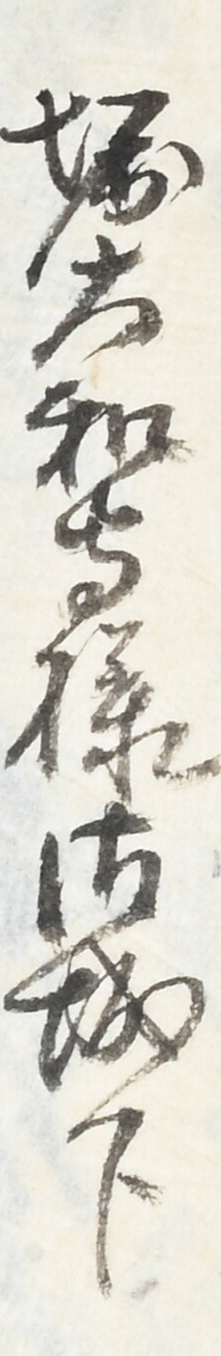堀大和守様御城下
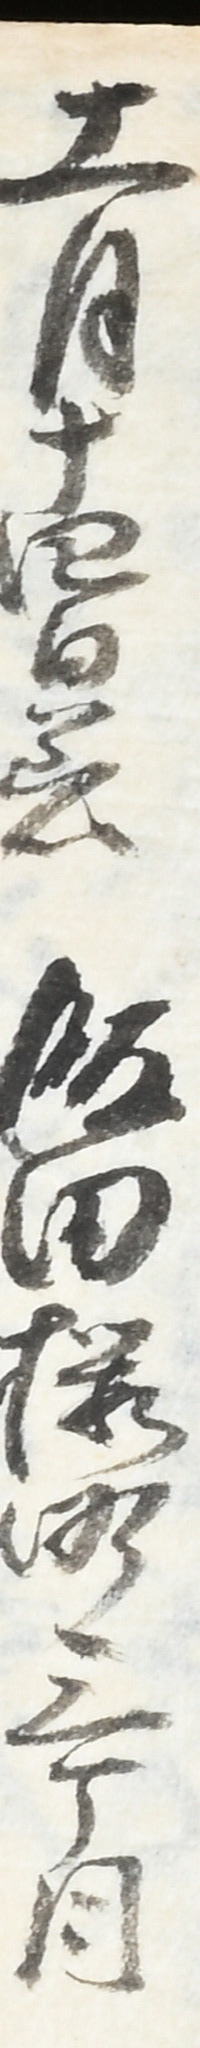十一月十三日着飯田知久町弐丁目

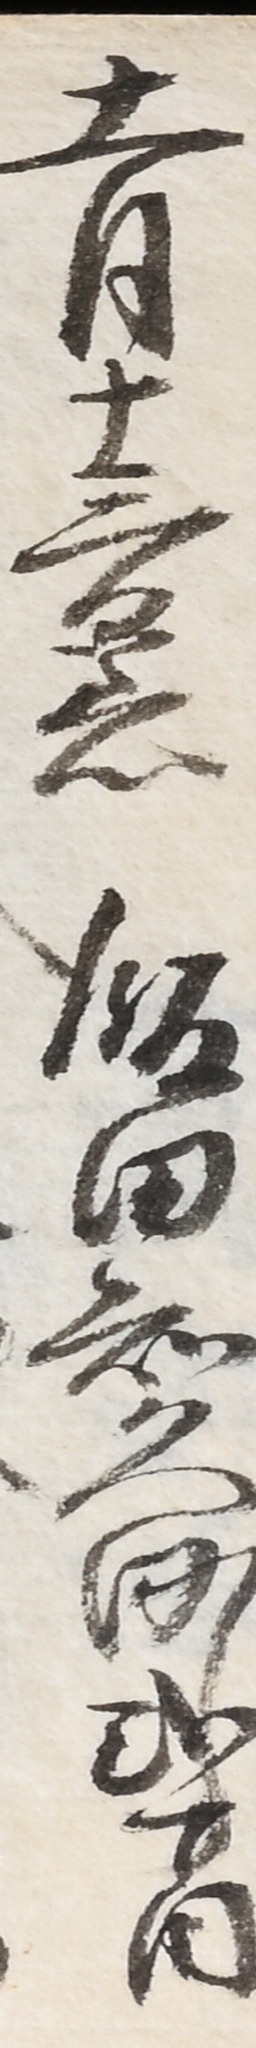十一月十四日着飯田桜町三丁目
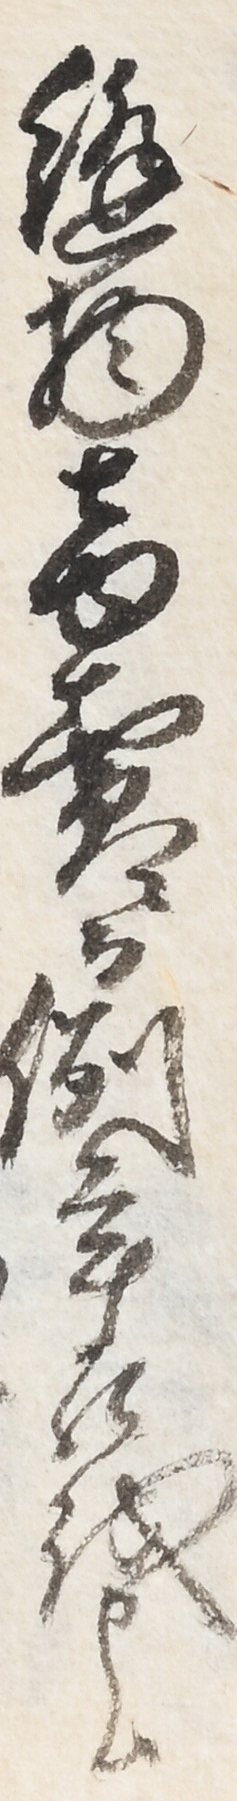薬商売ニ而例年罷越申候
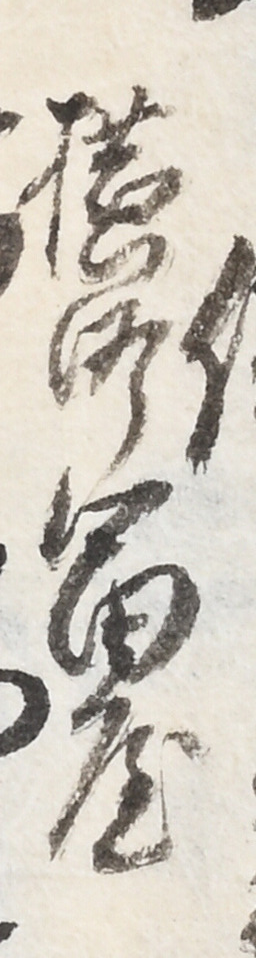横町塩屋
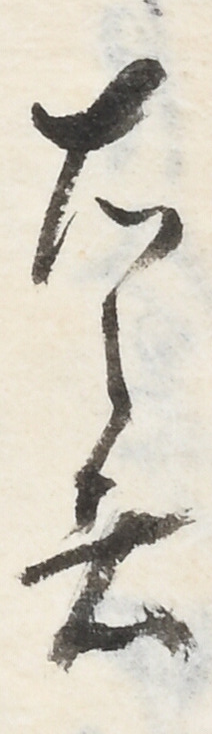右之者
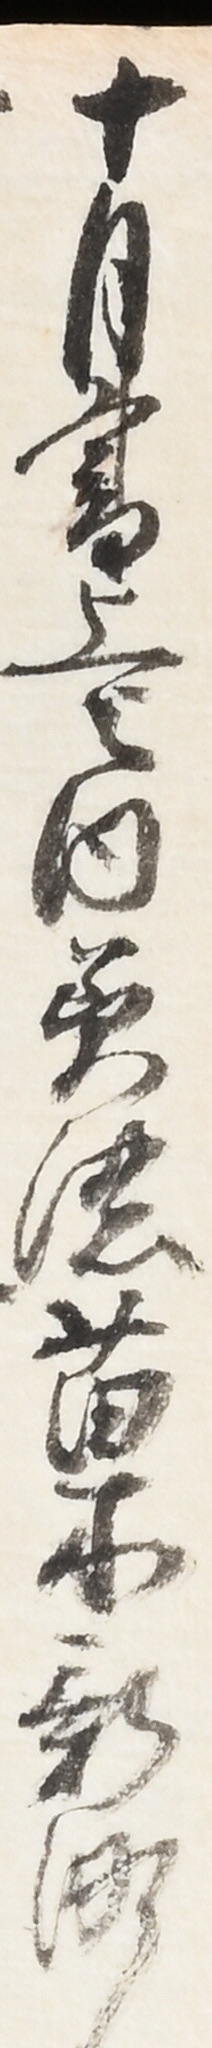十月書上之内美濃苗木新町
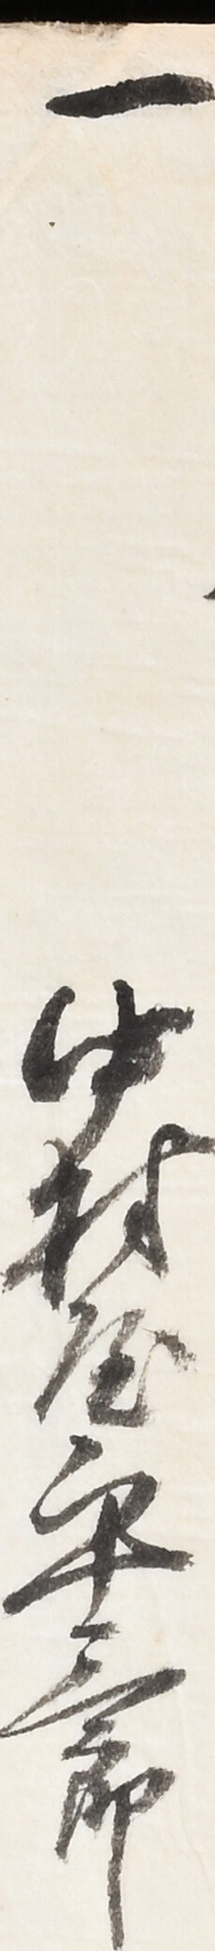一中村屋平三郎
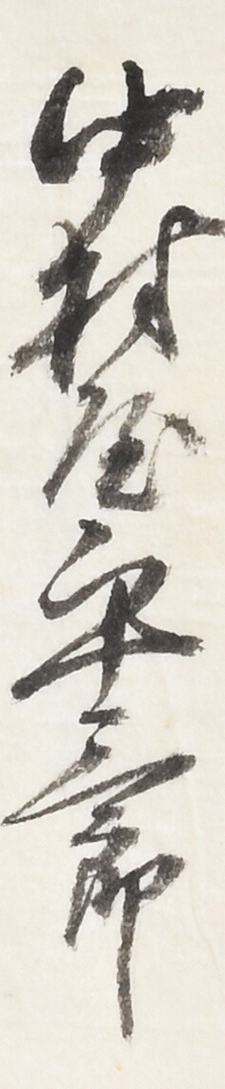一中村屋平三郎
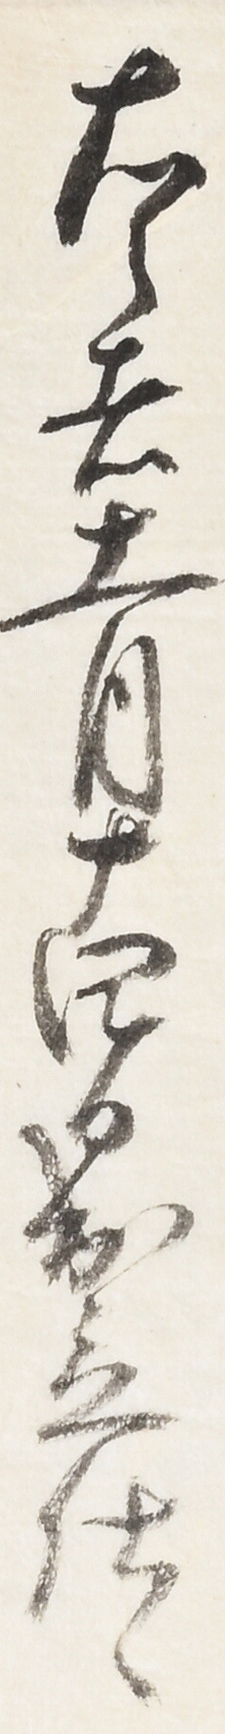右之者十一月十四日出立仕候
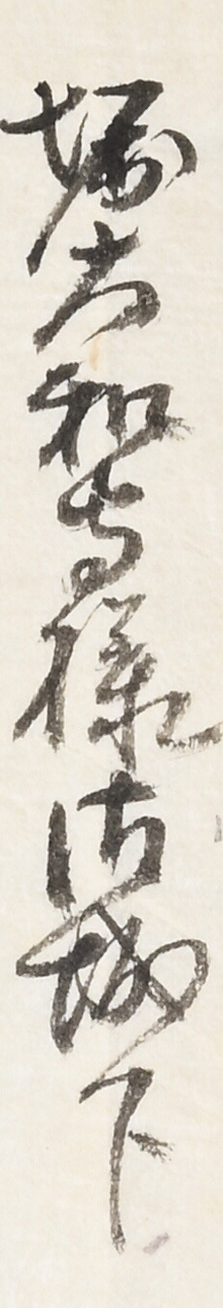堀大和守様御城下
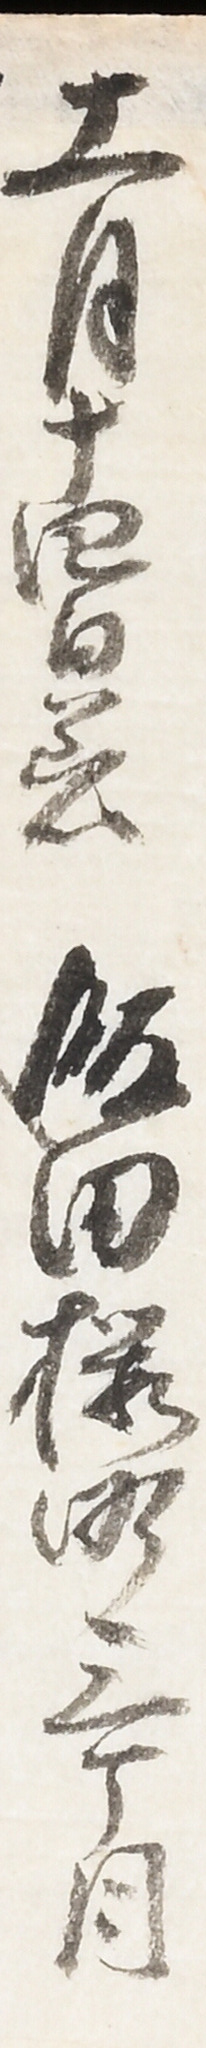十一月十四日着飯田桜町三丁目
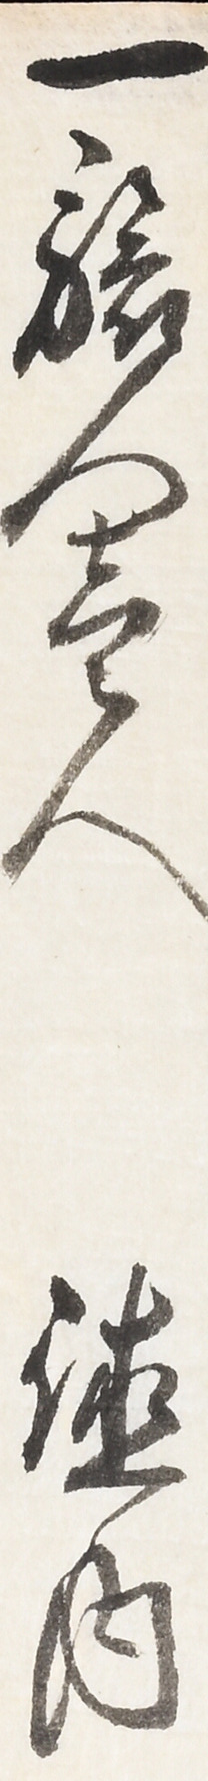一旅人壱人徳内
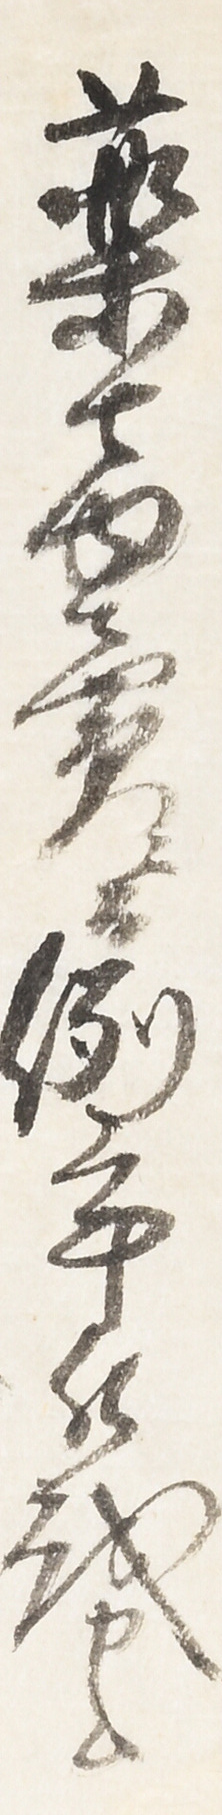薬商売ニ而例年罷越申候
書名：旅人泊控帳
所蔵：伊那市立高遠町図書館・合同会社AMANE
